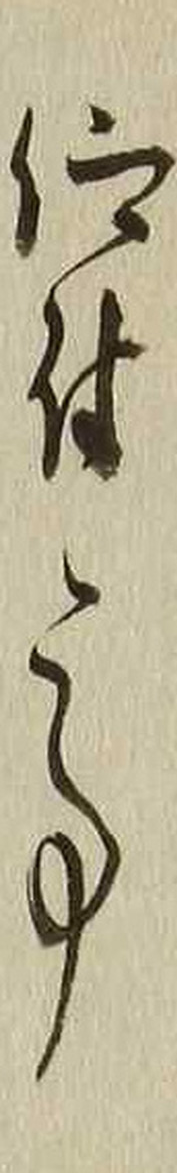仰付候事
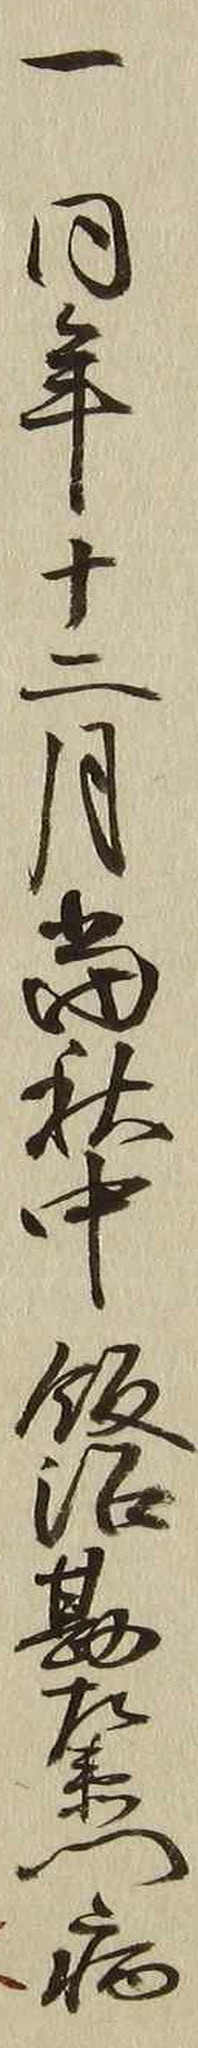一同年十二月当秋中飯沼勘左衛門病
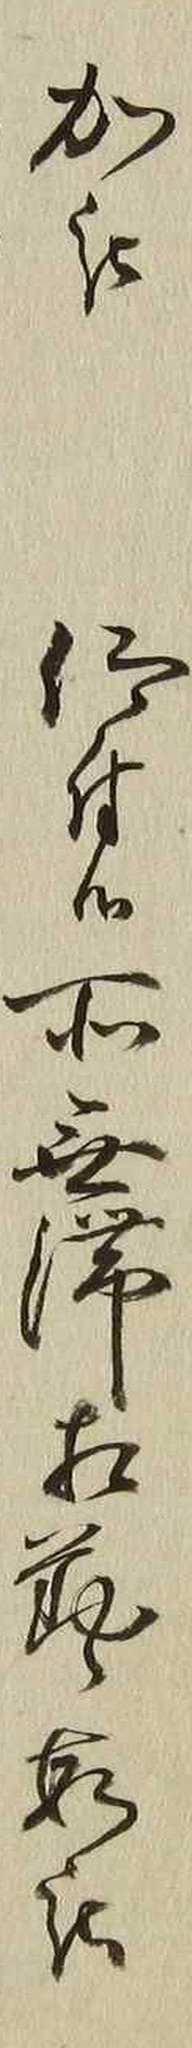加被仰付候所無滞相勤候段被
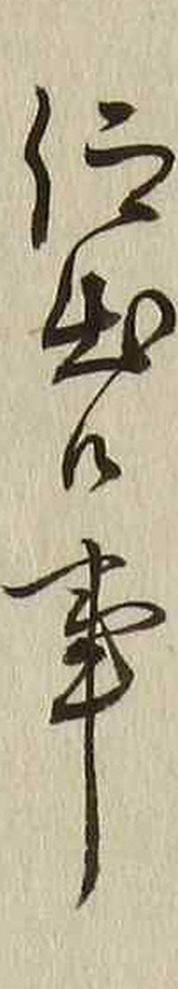仰出候事
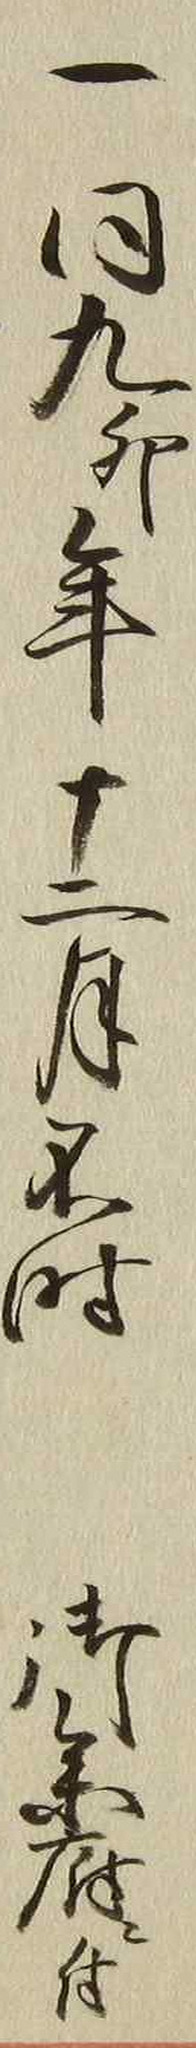一同九卯年十二月不時御参府ニ付
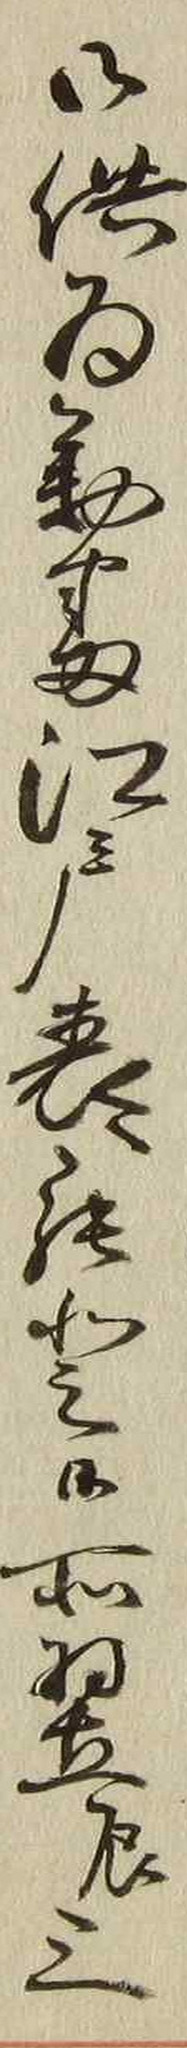御供為勤番江戸表へ罷登候所翌辰三
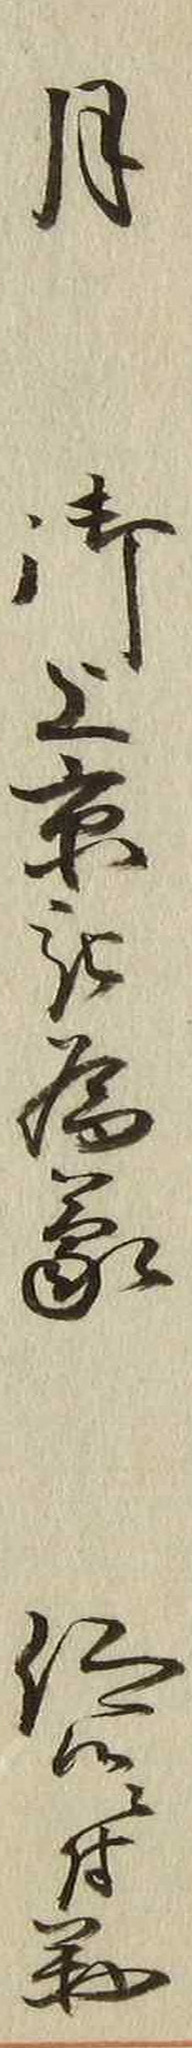月御上京被為蒙仰候ニ付勤
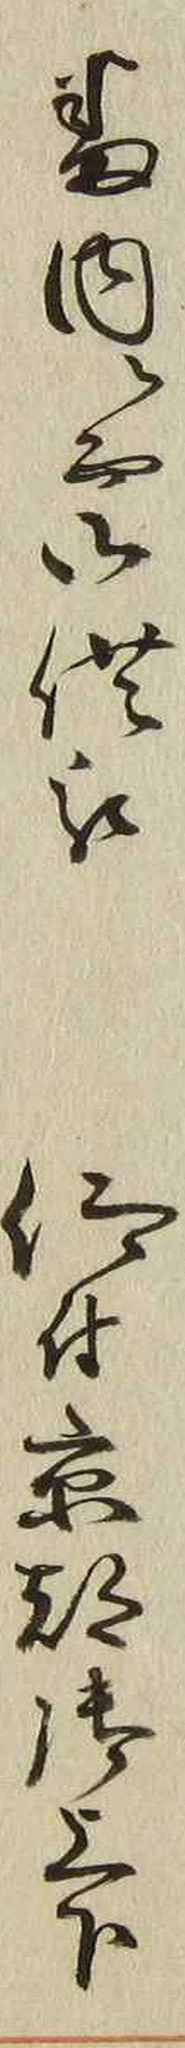番内ニ而御供江仰付京都御上下
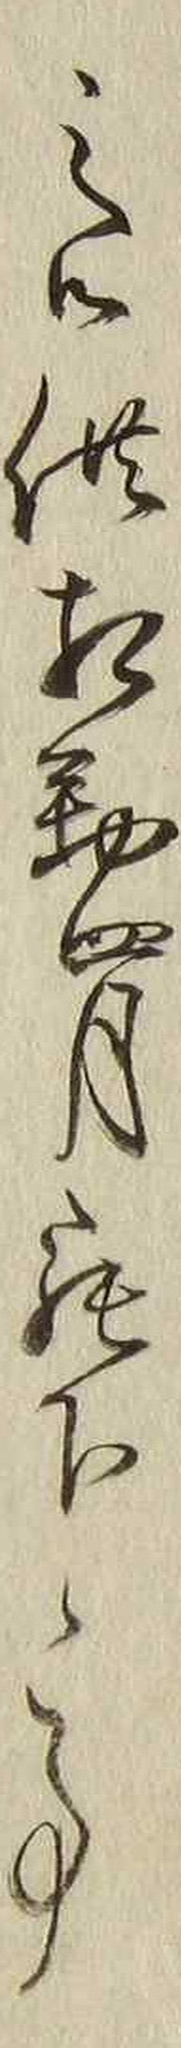之御供相勤四月罷下候事
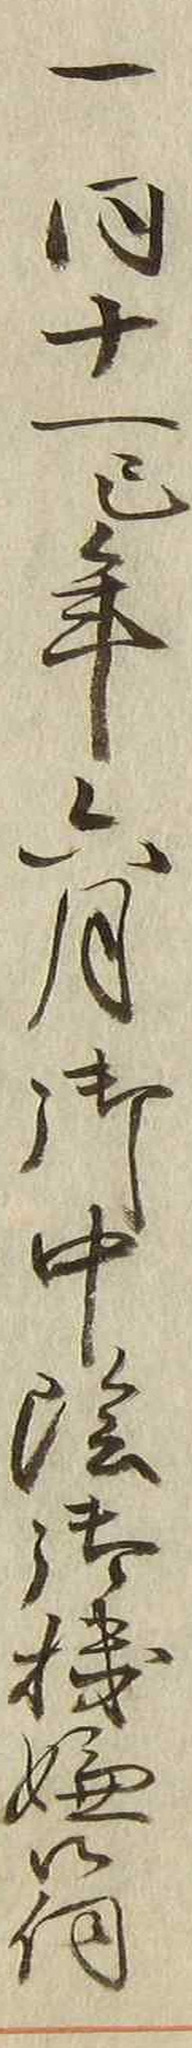一同十一巳年六月御中陰御機嫌御伺
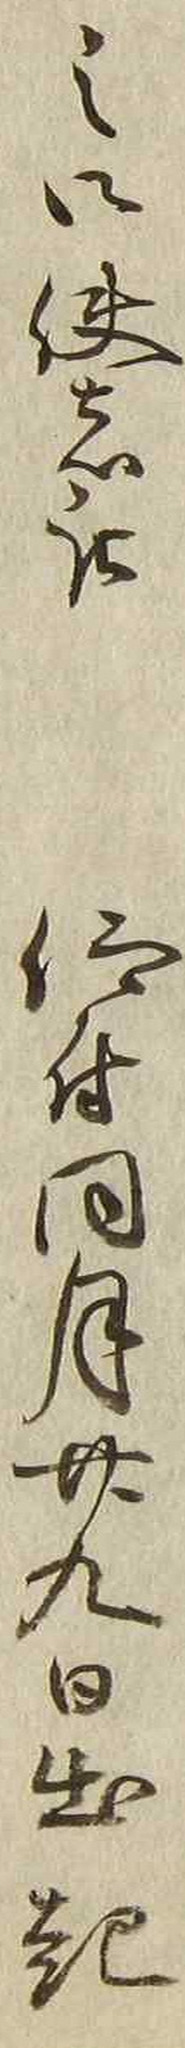之御使者被仰付同月廿九日出起
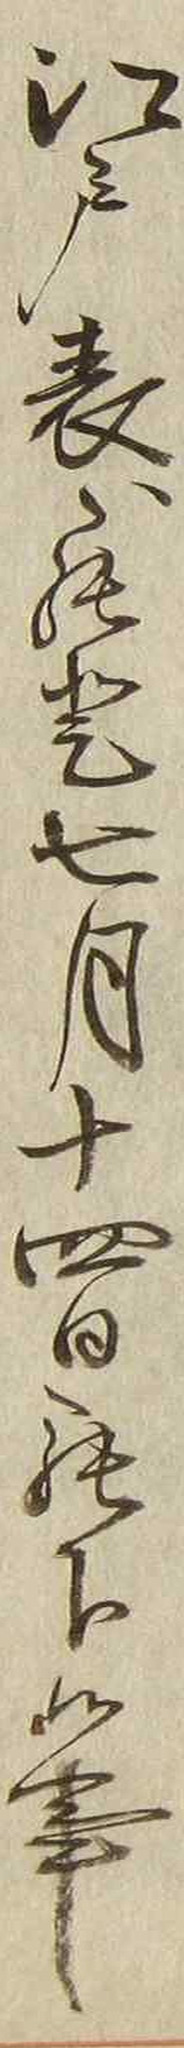江戸表へ罷登七月十四日罷下候事

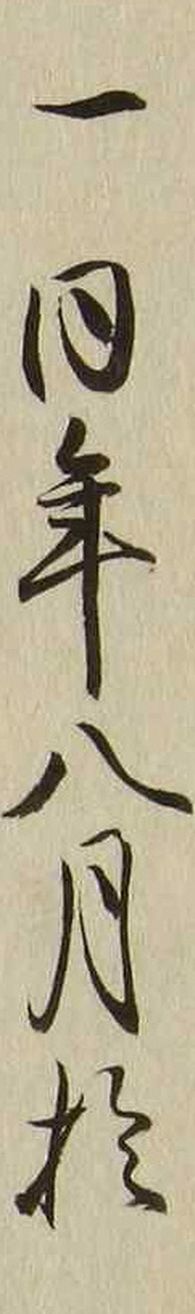一同年八月於
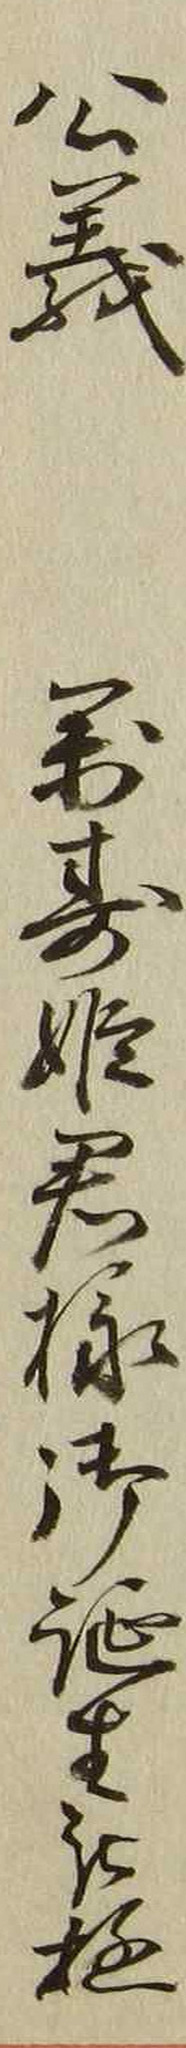公儀万寿姫君様御誕生被遊
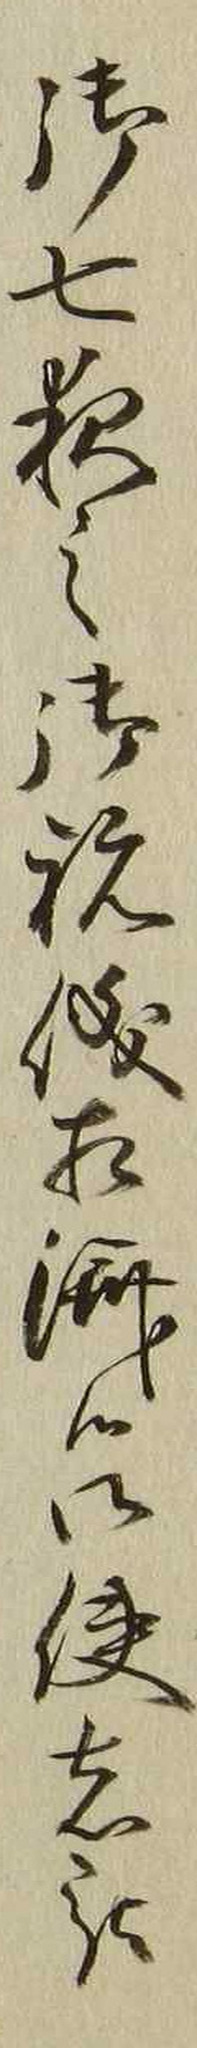御七夜之御祝儀相済候御使者被
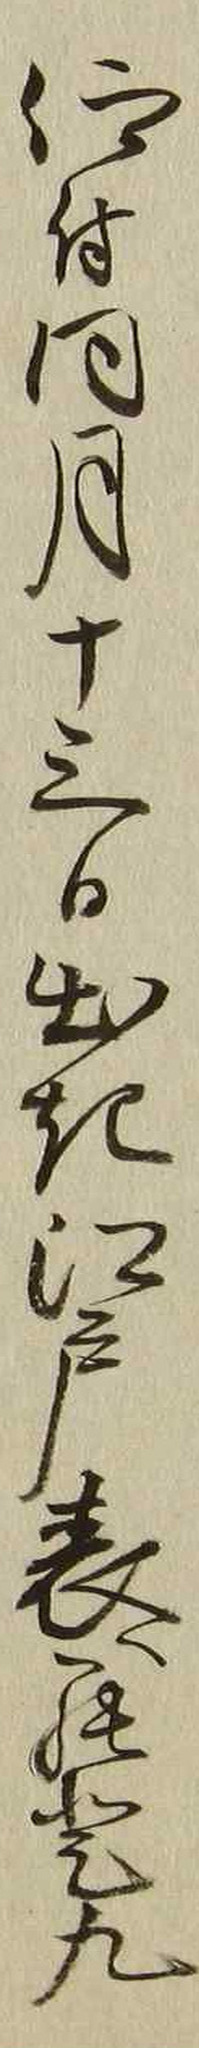仰付同月十三日出起江戸表へ罷登九
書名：諸士系譜　巻之60　と之部3
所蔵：会津若松市立会津図書館
